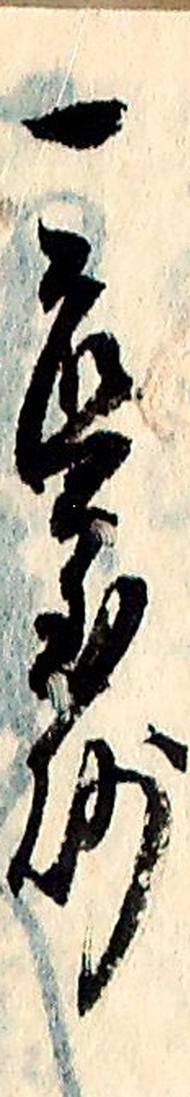一藍玉砂
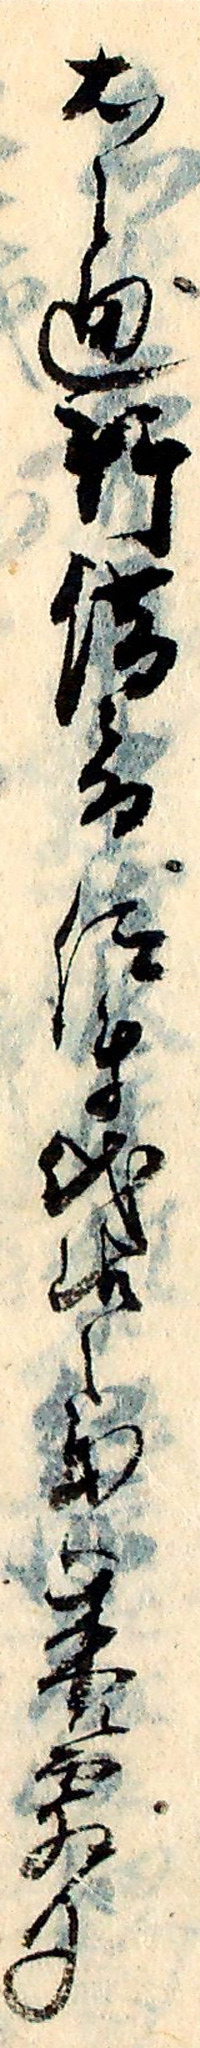右之通拝借被為仰付代銀之義は来る霜月
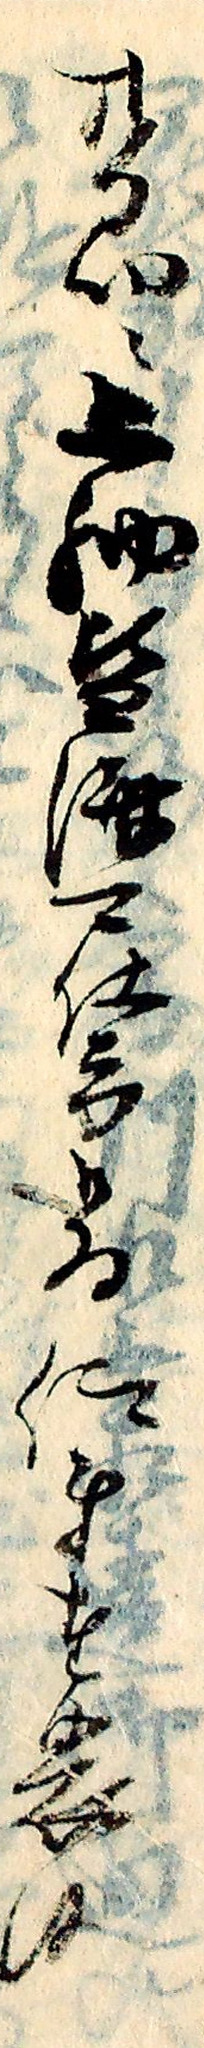廿日切に上納皆済可仕旨被為仰付奉畏候
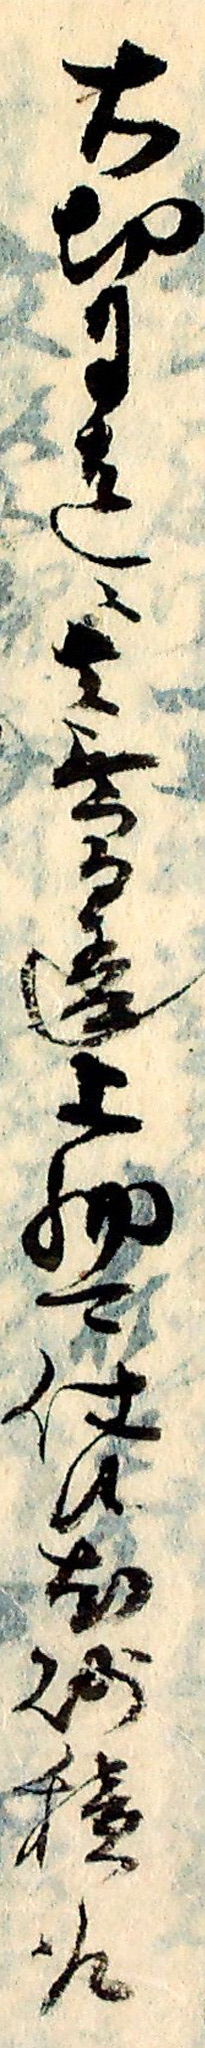右切月迄には無間違上納可仕候尤砂積取
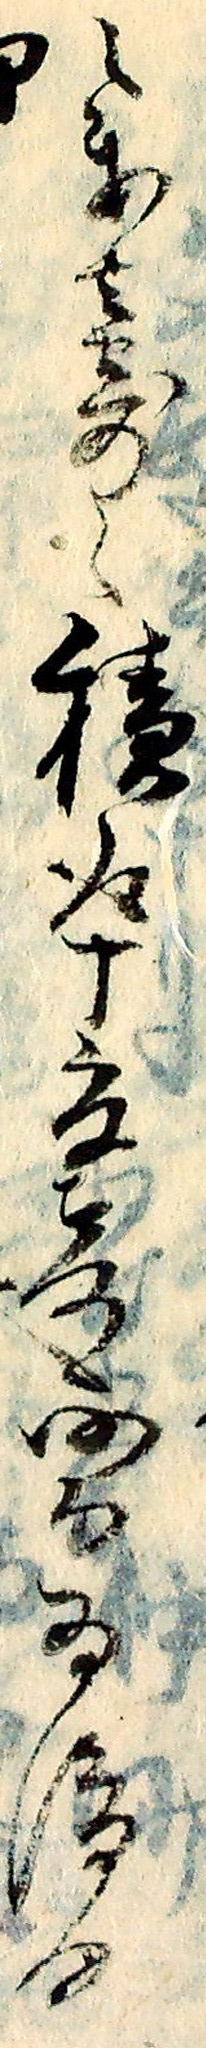之義は寄々積取申度奉存候仍て為後日
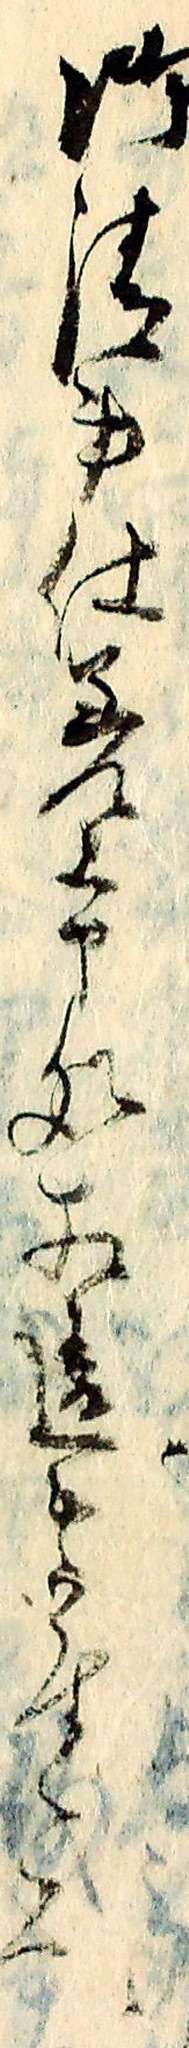御請書仕差上申処相違無御座候以上
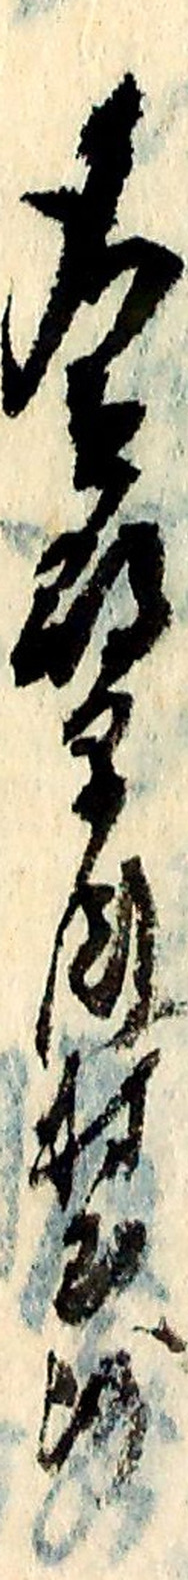名東郡早淵村玉師
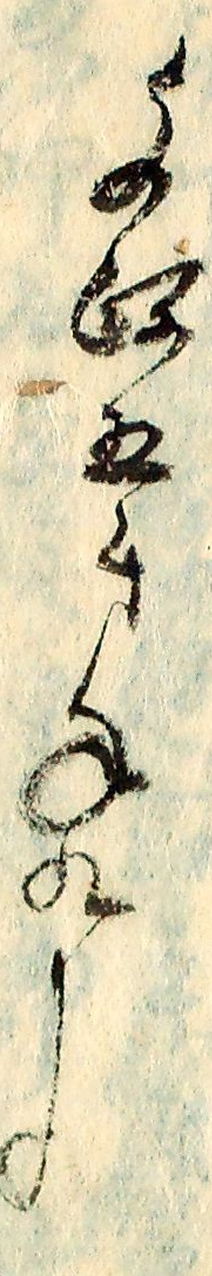文政五午年九月
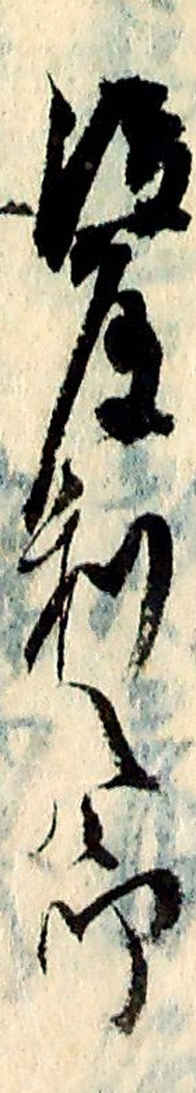後藤利八郎
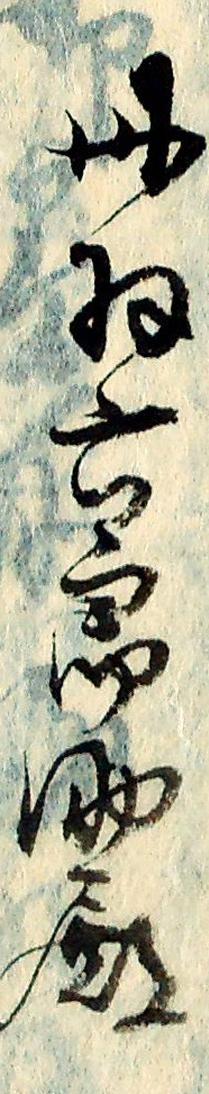丹羽六郎助殿

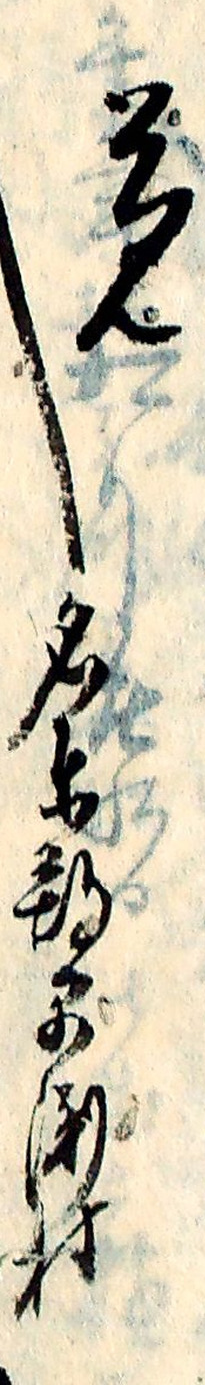名東郡早淵村
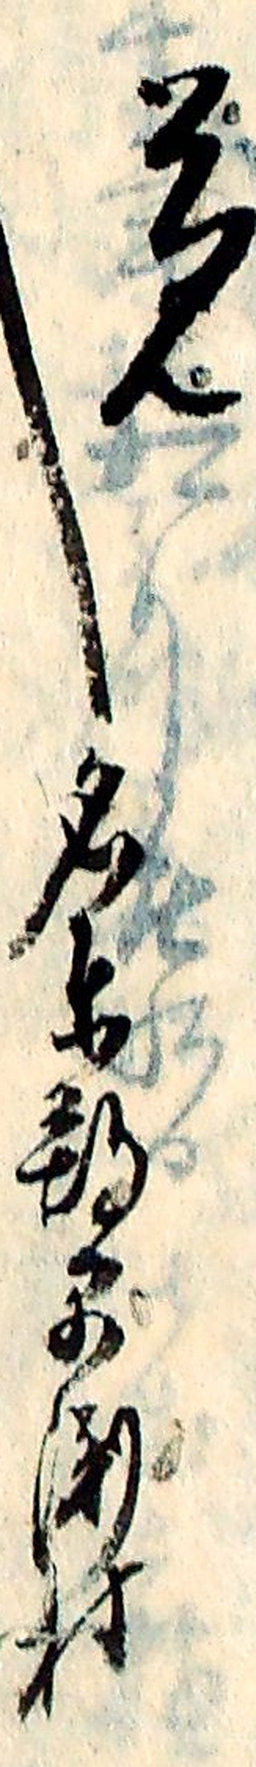名東郡早淵村
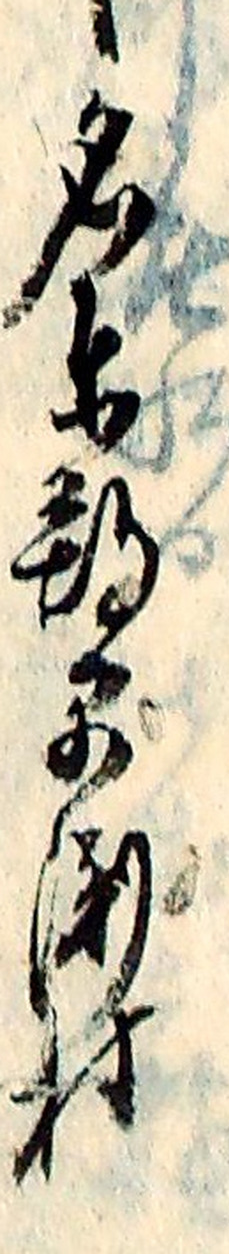名東郡早淵村
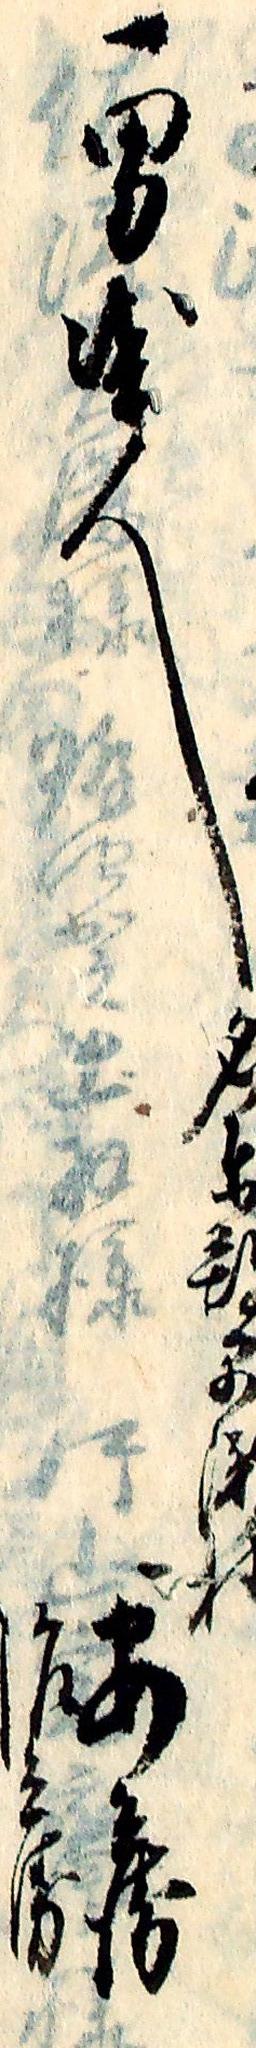一男弐人安兵衛
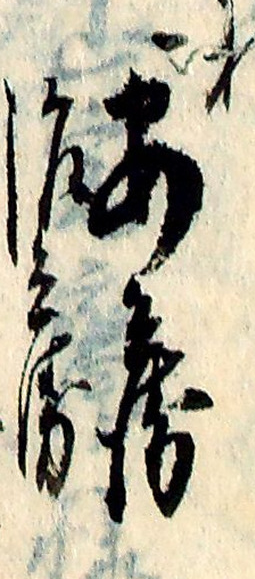作兵衛
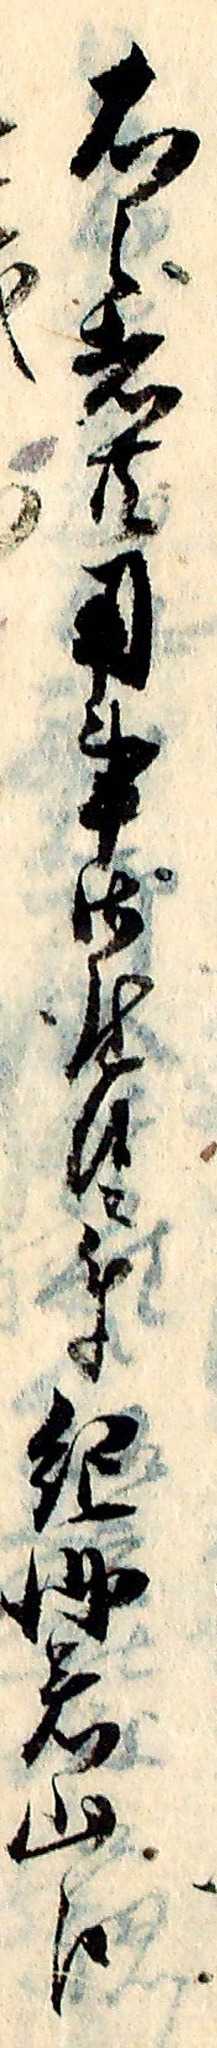右之者共用事御座候に付紀州若山え
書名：諸御願書控(後藤氏壱番）
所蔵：鳴門教育大学 Naruto University of Education
